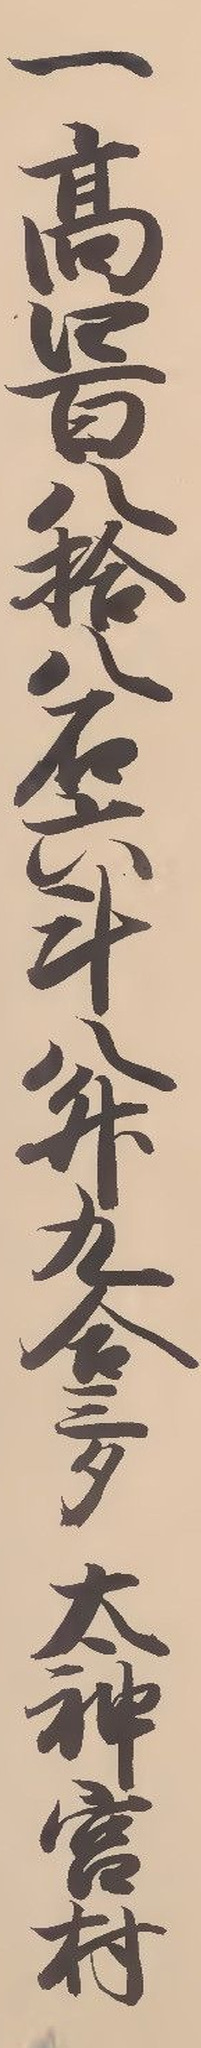一高四百八拾八石六斗八升九合三勺太神宮村
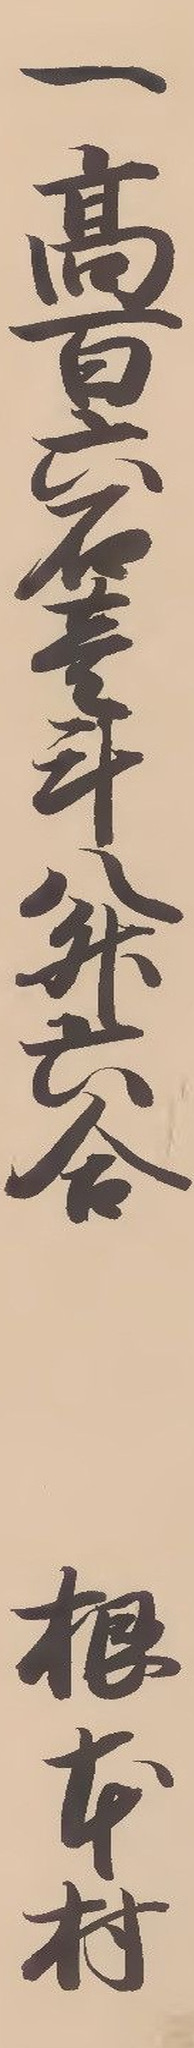一高百六石壱斗八升六合根本村
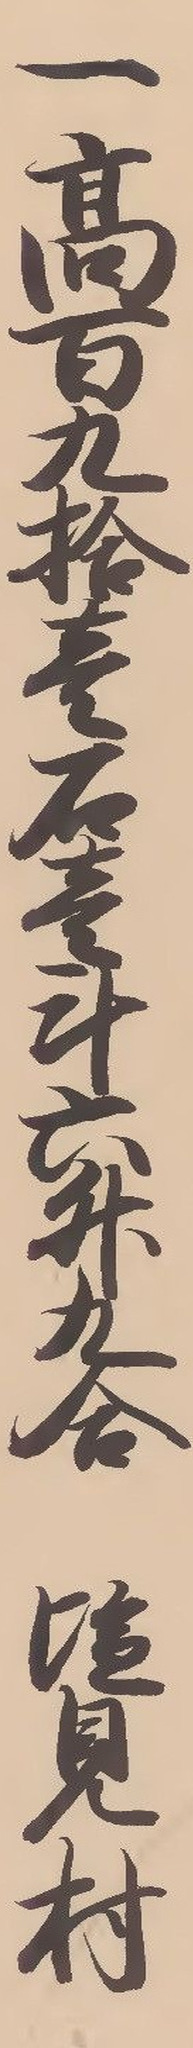一高百九拾壱石壱斗六升九合塩見村
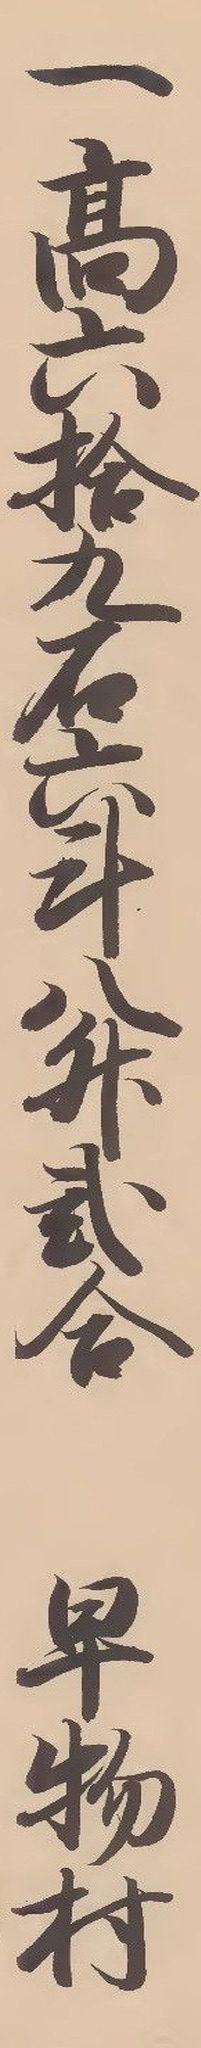一高六拾九石六斗八升弐合早物村
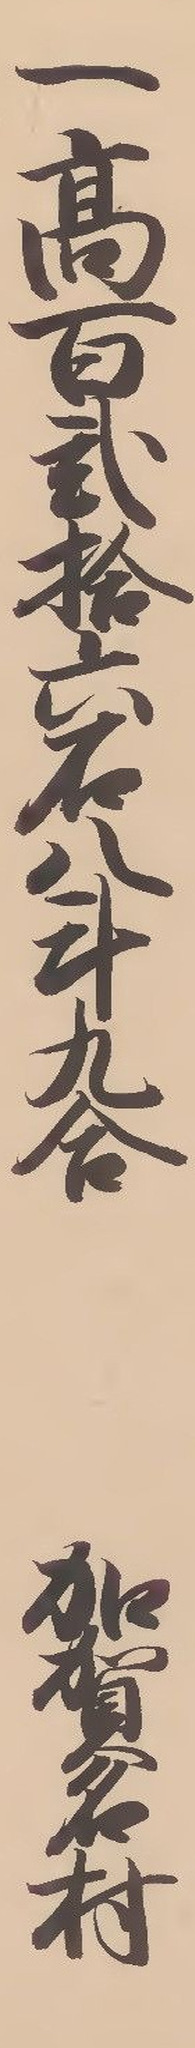一高百弐拾六石八斗九合加賀名村

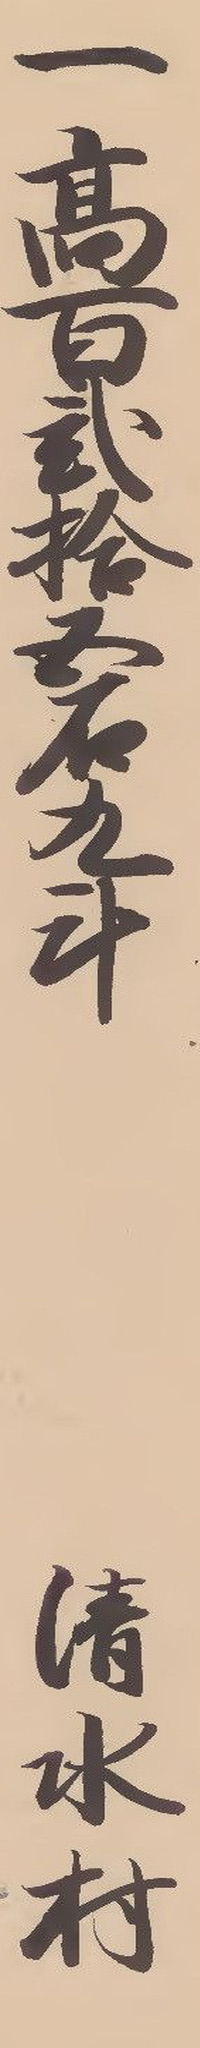一高百弐拾五石九斗清水村
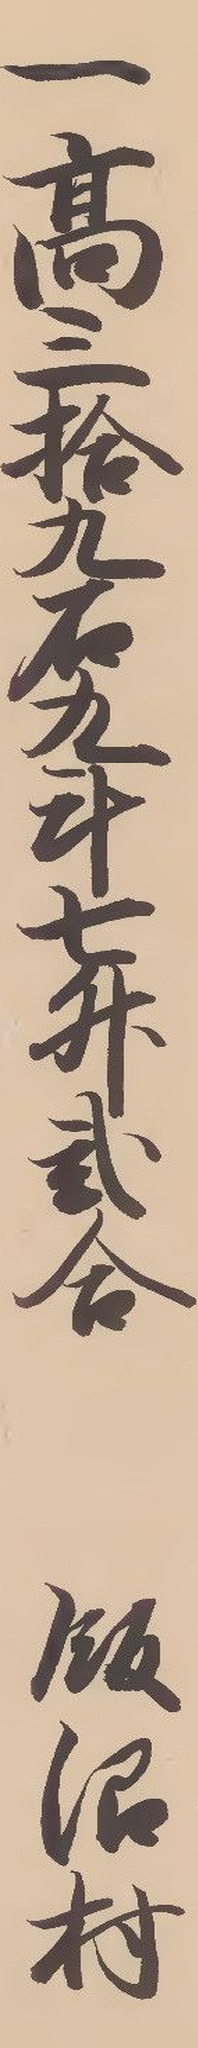一高三拾九石九斗七升弐合飯沼村
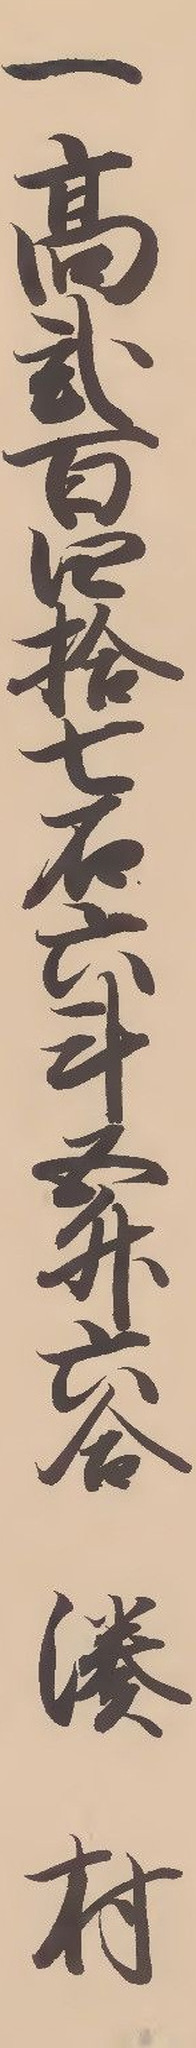一高弐百四拾七石六斗五升六合湊村
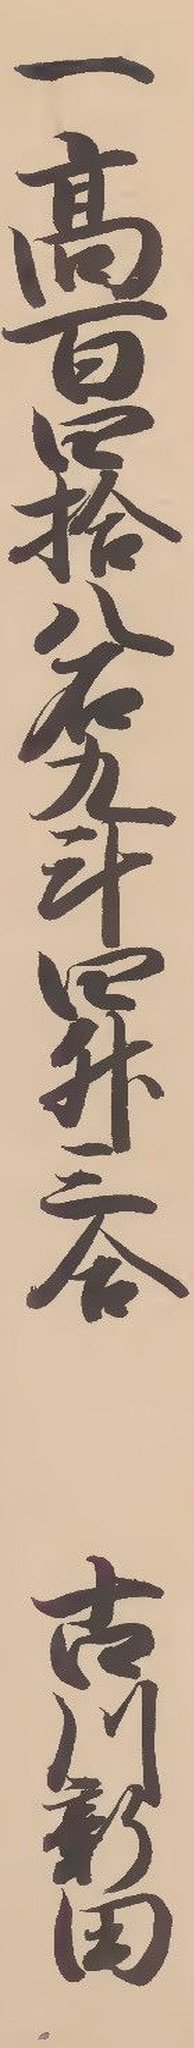一高百四拾八石九斗四升三合古川新田村
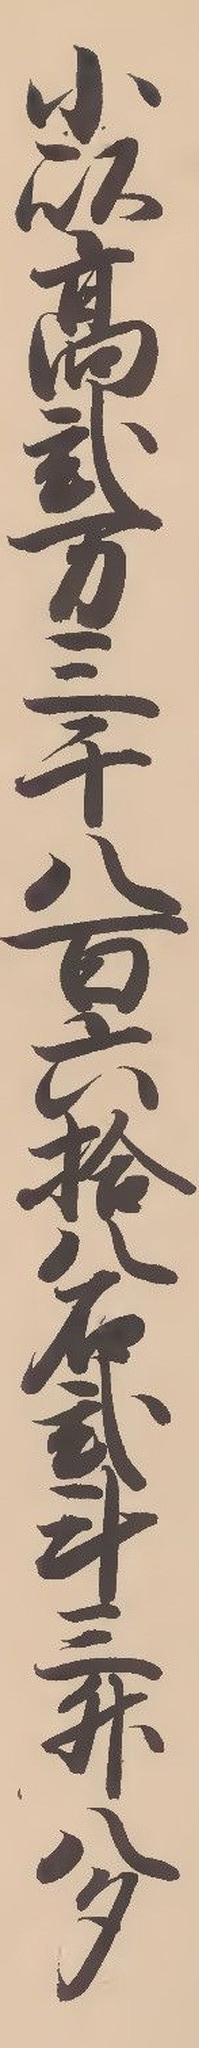小以高弐万三千八百六拾八石弐斗三升八勺
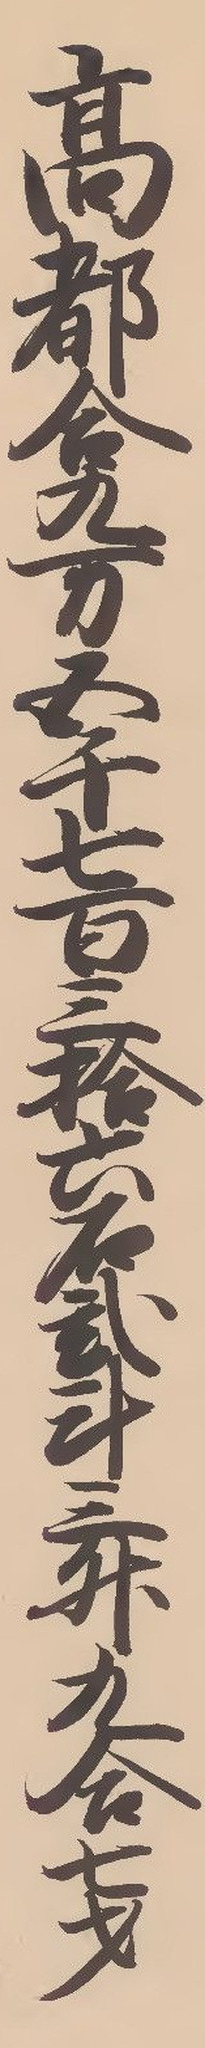高都合九万五千七百三拾六石弐斗三升九合七才
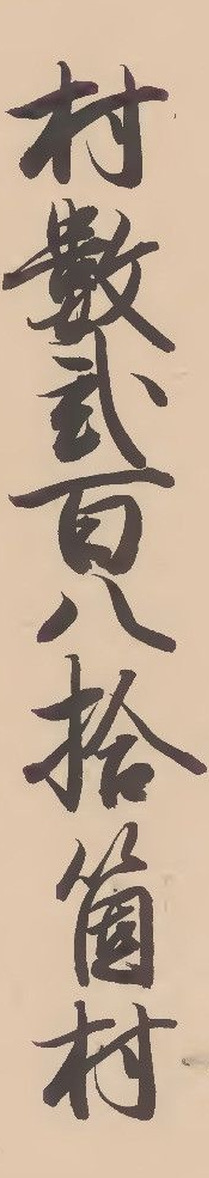村数弐百八拾箇村

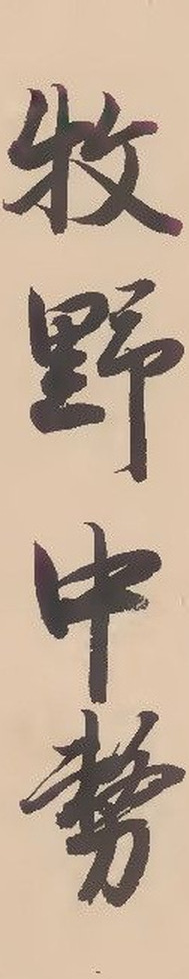牧野中務
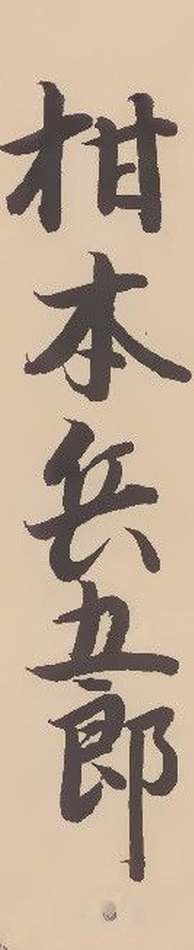柑本兵五郎
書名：安房国郷帳
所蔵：国立公文書館 National Archives of Japan
